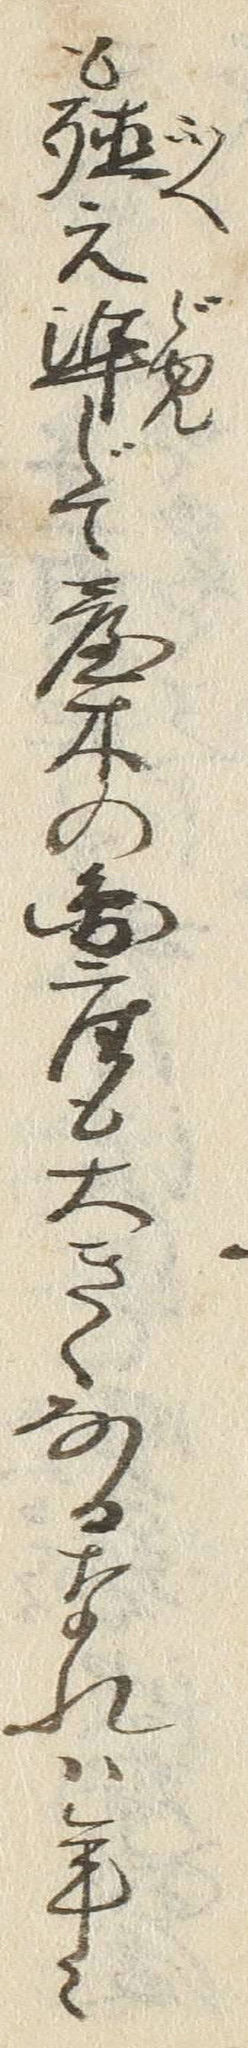も殖え準じて臺木の圓座も大きくなるなれは年々
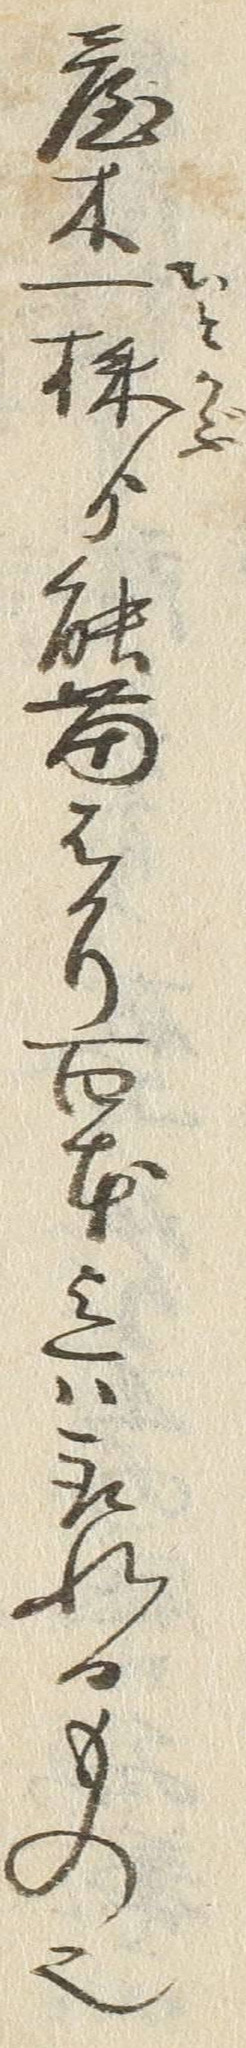臺木一株ゟ能苗はかり百本迄は取れるもの也
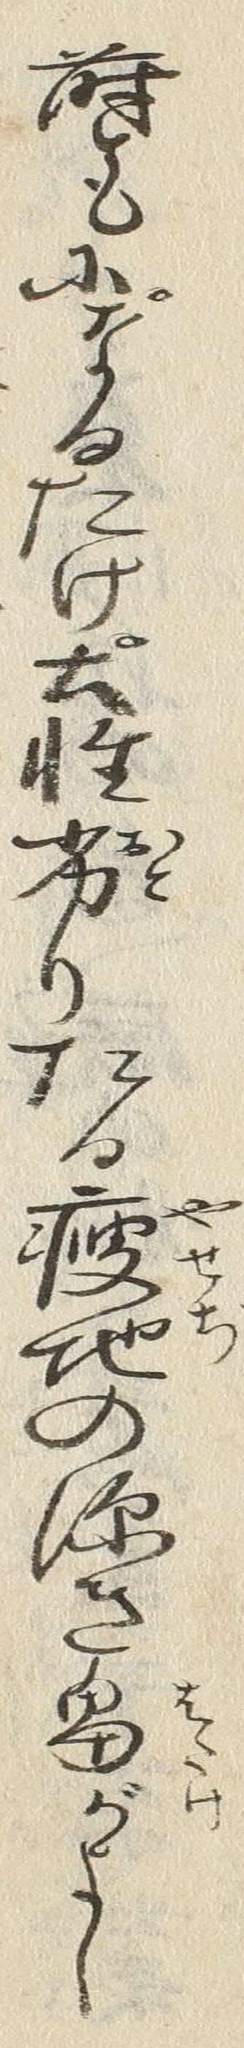蒔とも尓なるたけ土性劣りたる痩地の深き畠がよし
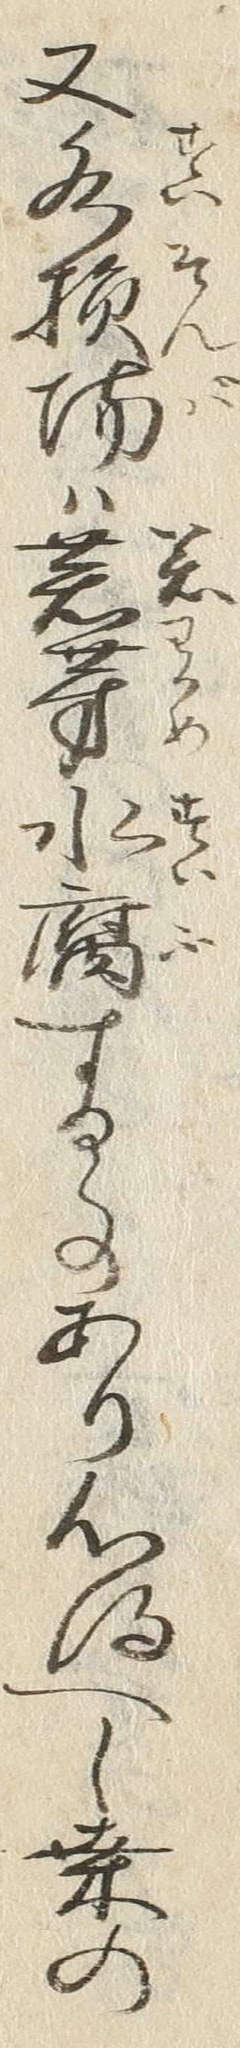又水損場は若芽水腐する事あり心得へし桑の
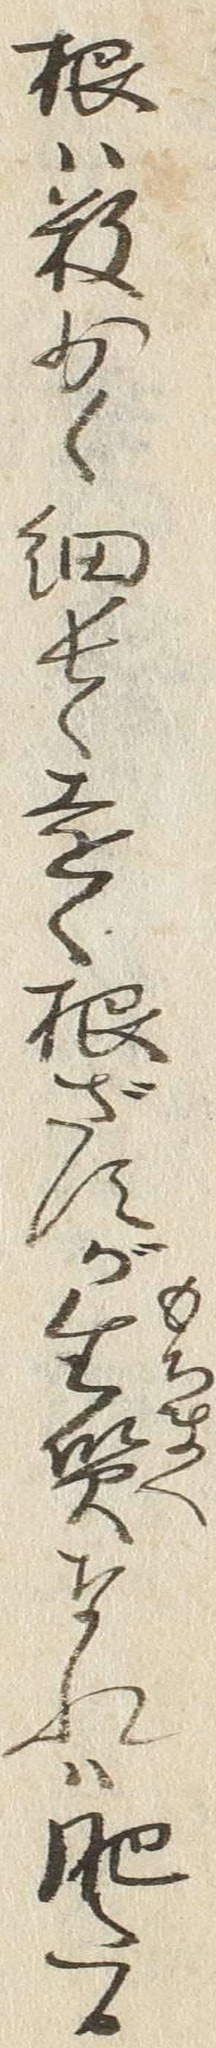根は数少く細長く遠く根ざ須が生質なれは肥たる
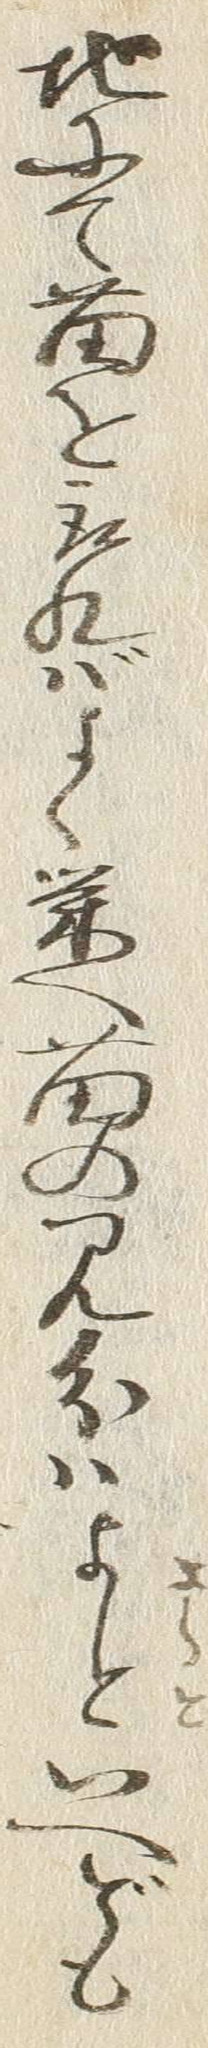地尓て苗を取ればよく栄へ苗の見分はよしといへども
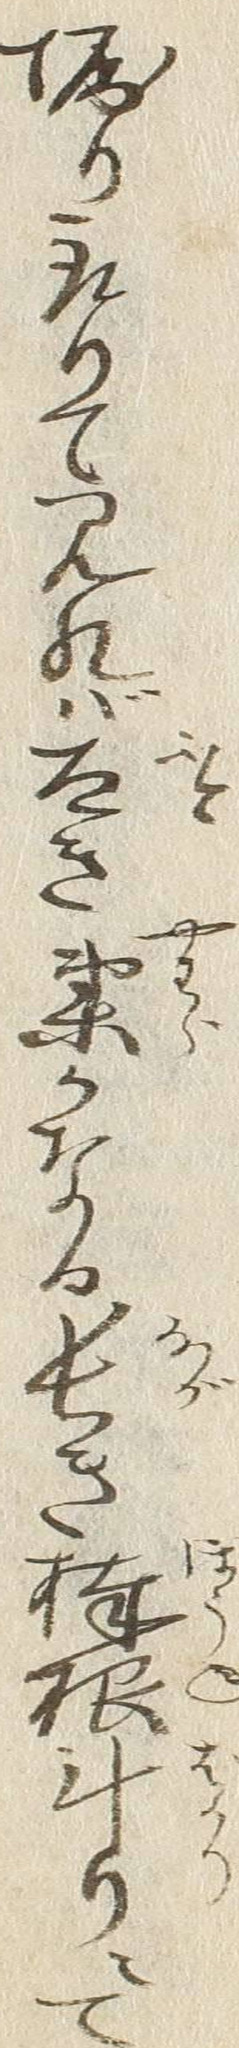堀り取りて見れば太き柔かなる長き棒根斗りにて
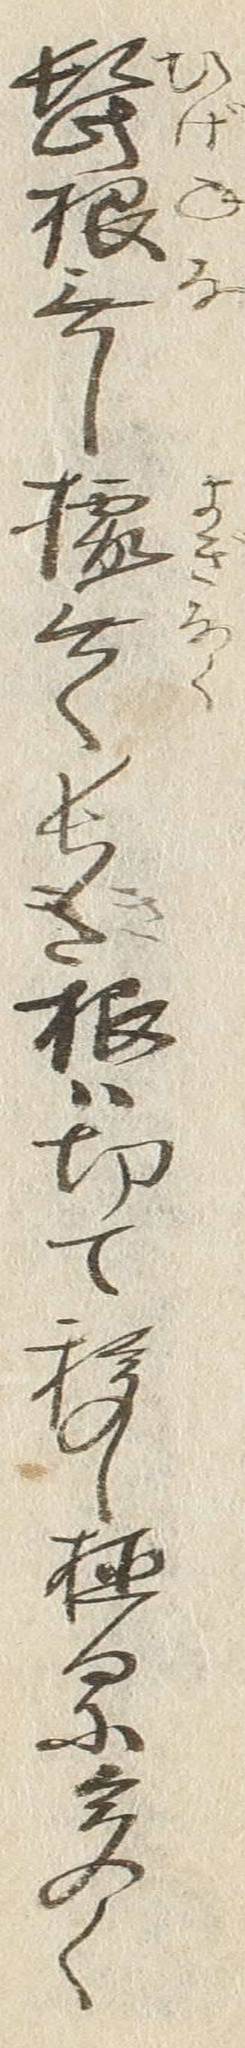髭根無し據無く長き根は切て移し植る尓多く
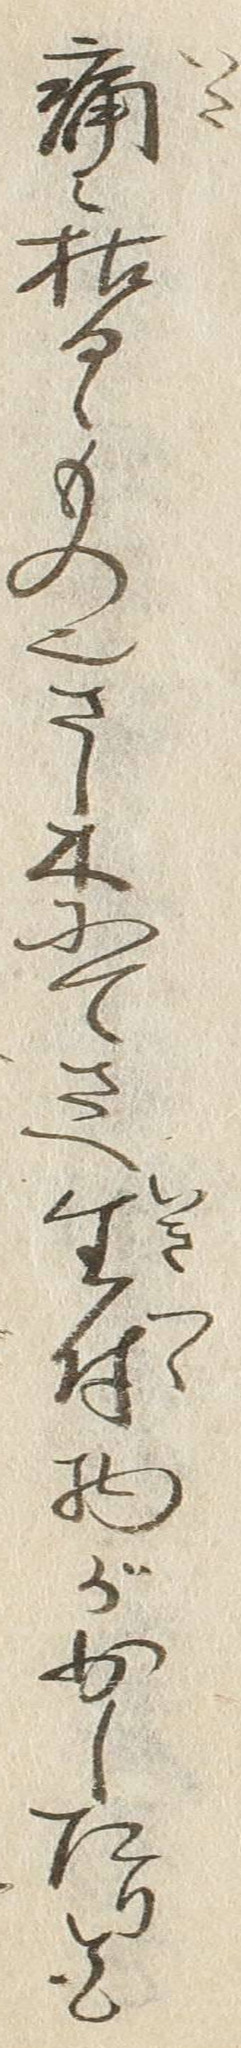痛み枯るゝもの也さし木尓てさへ生付物が少したりとも
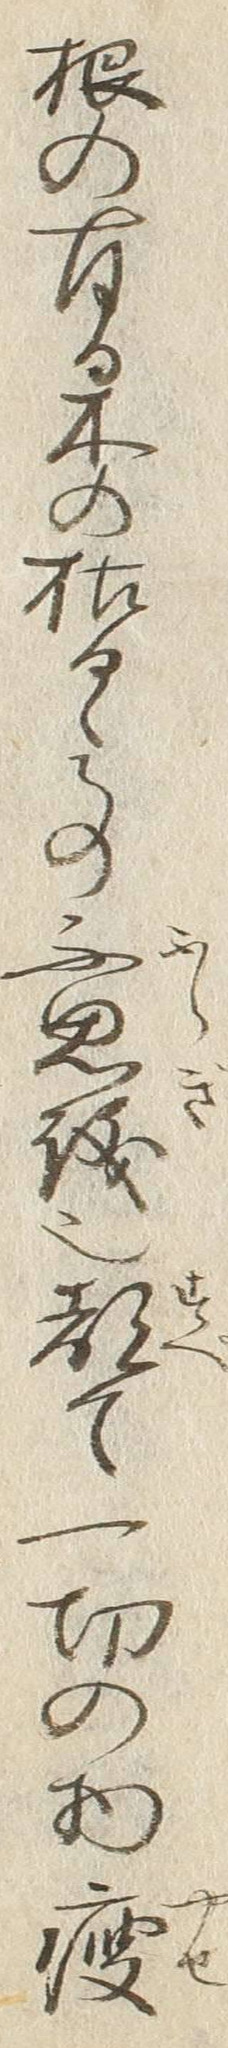根の有る木の枯るゝ事不思議也都て一切の物痩
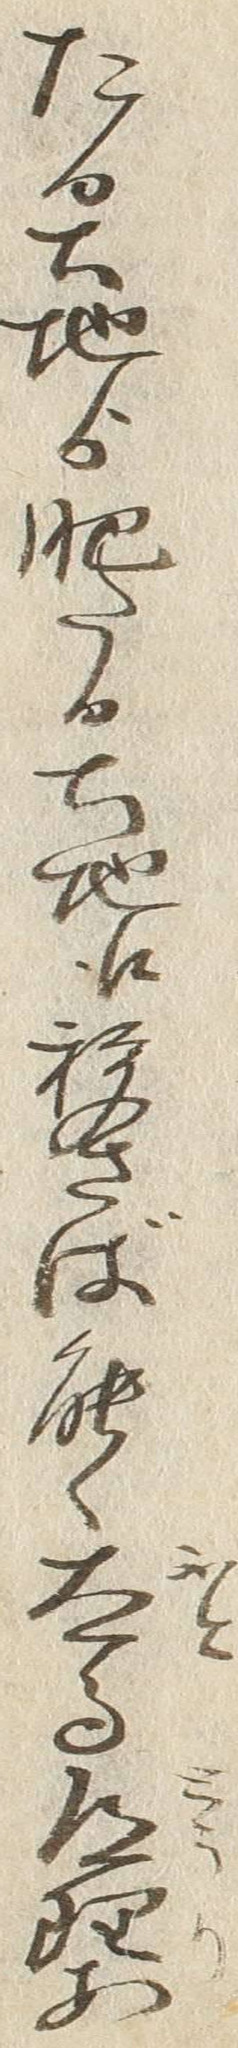たる土地ゟ肥たる土地江移さば能く太る道理あ
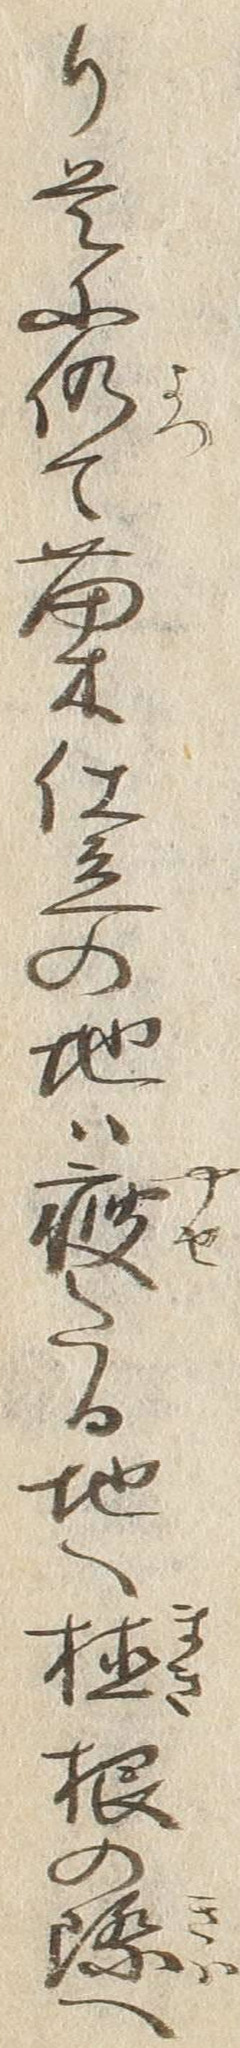り是尓仍て苗木仕立の地は痩たる地へ植根の際へ

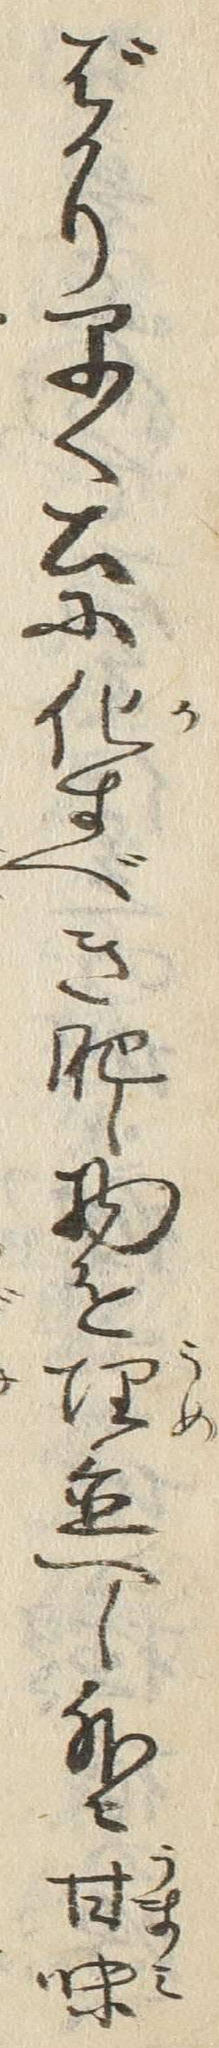ばかり早く土尓化すべき肥し物を埋置へし外に甘味
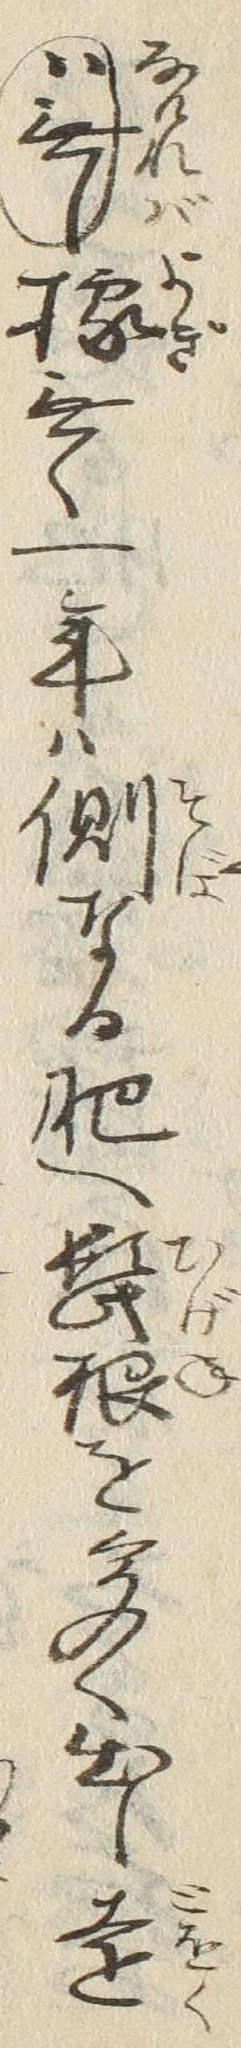なければ據無く一年は側なる肥へ髭根を多く出し遠
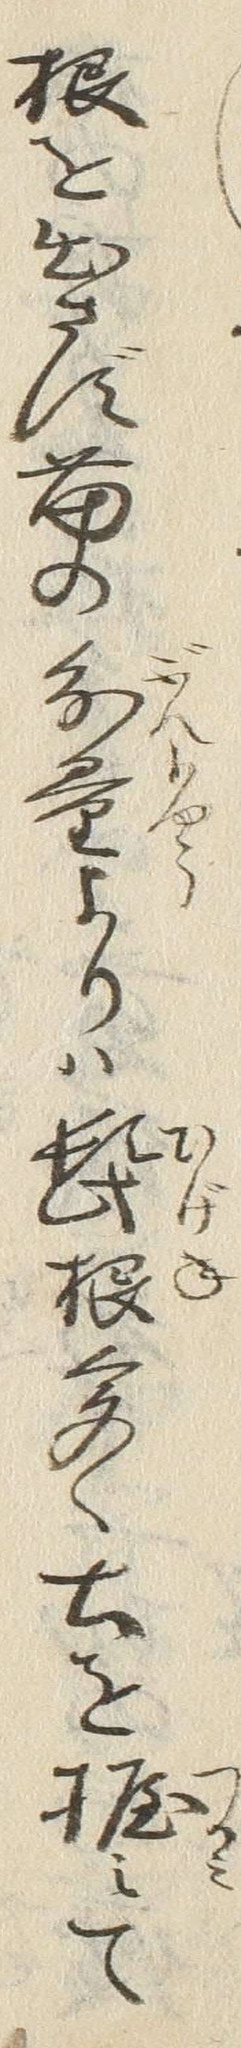根を出さず苗の分量よりは髭根多く土を握みて
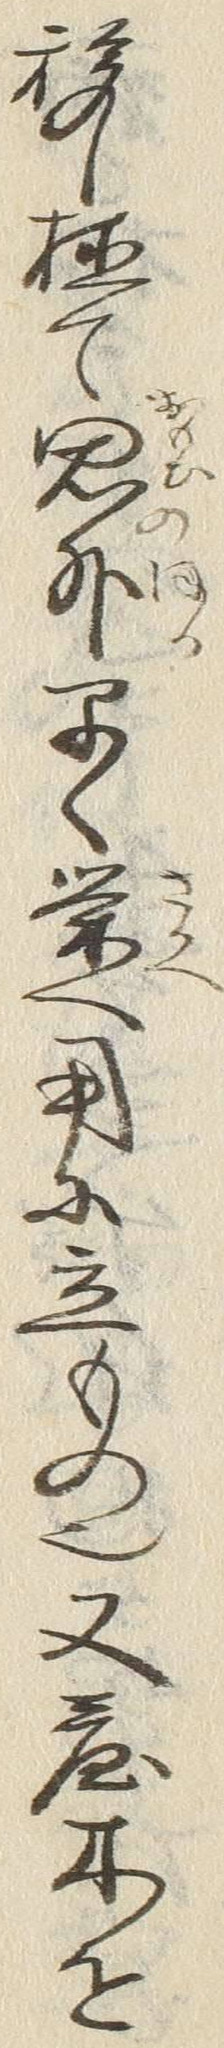移し植て思外早く栄へ用尓立もの也又臺木を
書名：養蠶實驗録後編
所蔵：東京大学農学生命科学図書館 国文学研究資料館
